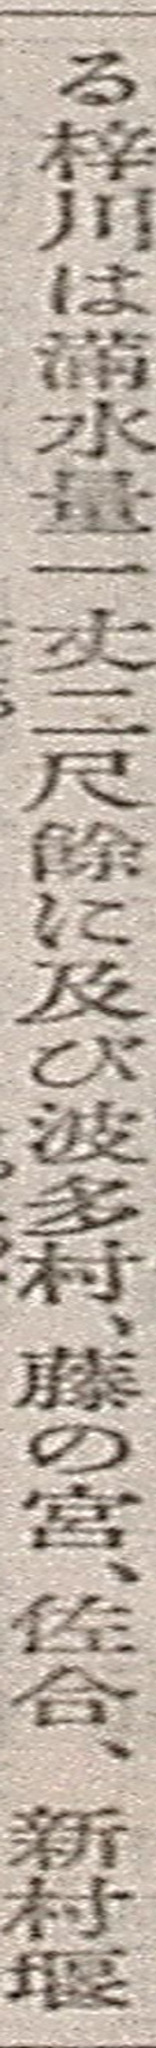る梓川は満水量一丈二尺餘に及び波多村、藤の宮、佐合、新村堰
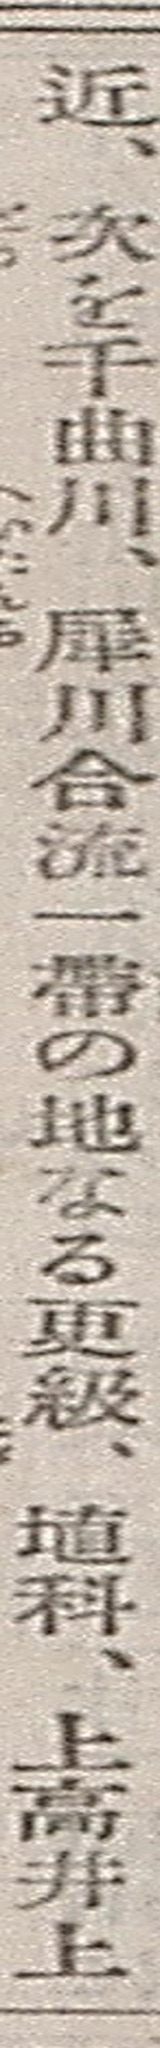近、次を千曲川、犀川合流一帯の地なる更級、埴科、上高井上
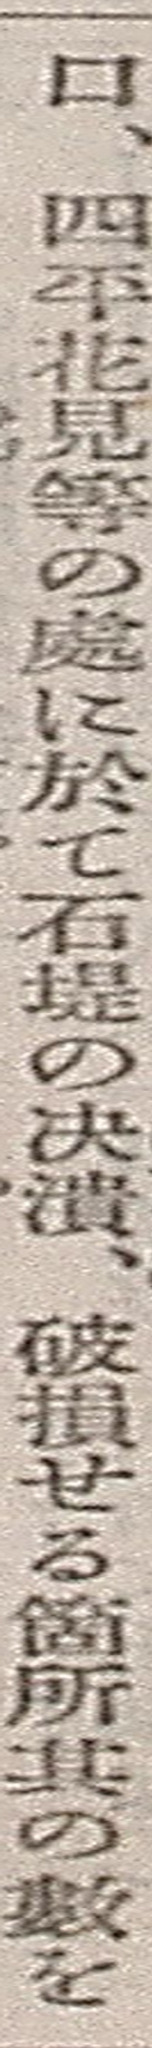口、四平花見等の処に於て石提の决潰、破損せる箇所其の数を
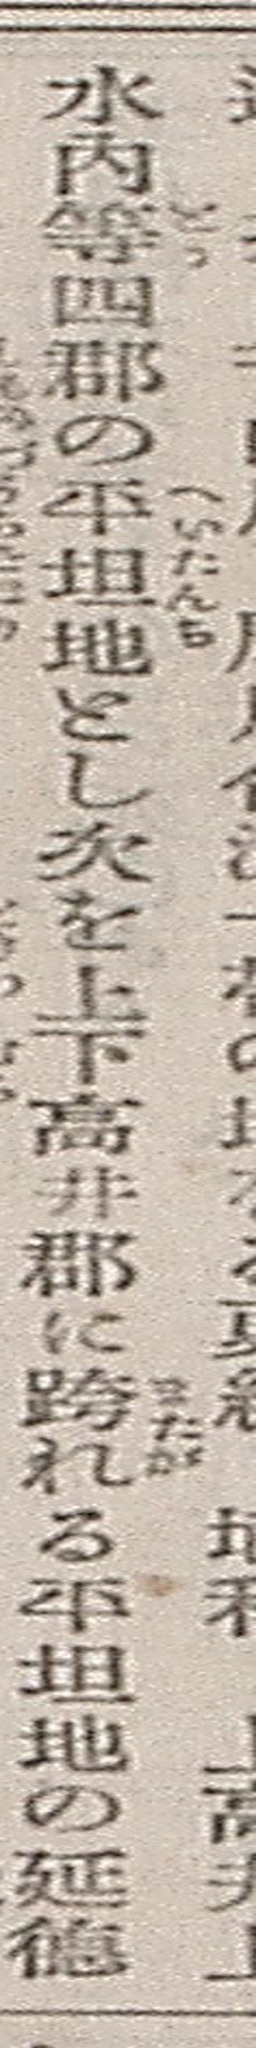水内等四郡の平坦地とし次を上下高井郡に跨れる平坦地の延徳
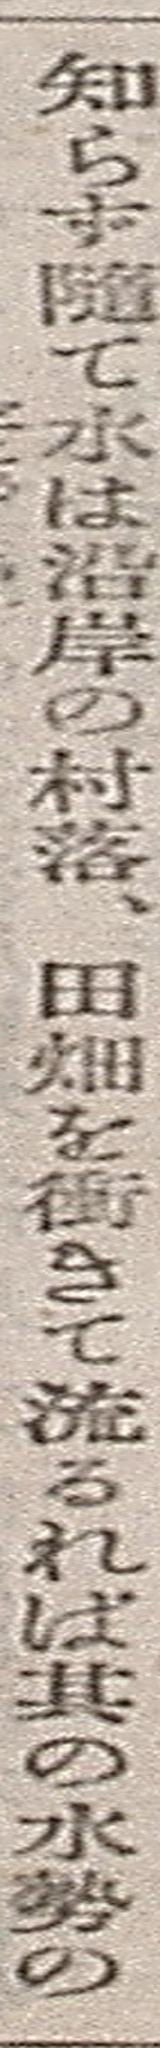知らず随て水は沿岸の村落、田畑を衝きて流るれば其の水勢の
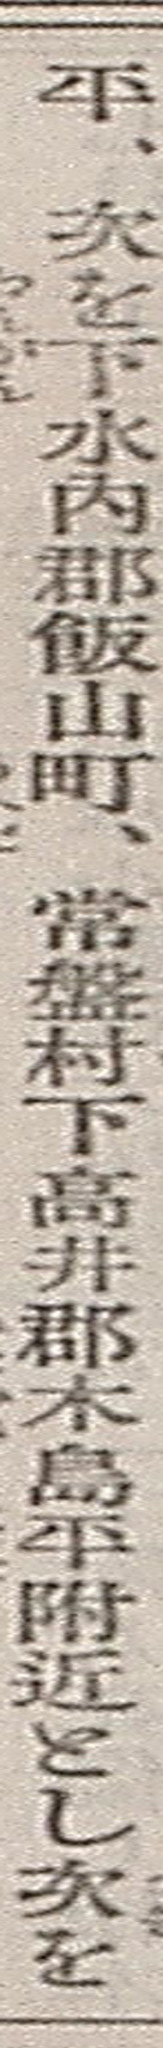平、次を下水内郡飯山町、常盤村下高井郡木島平附近とし次を
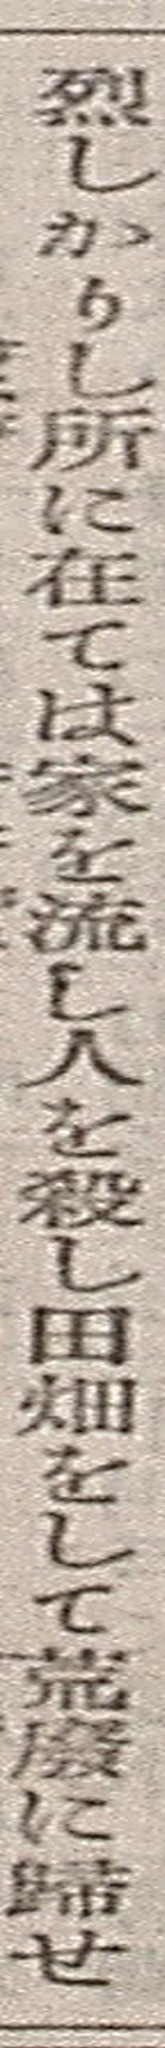烈しかりし所に在ては家を流し人を殺し田畑をして荒廃に帰せ
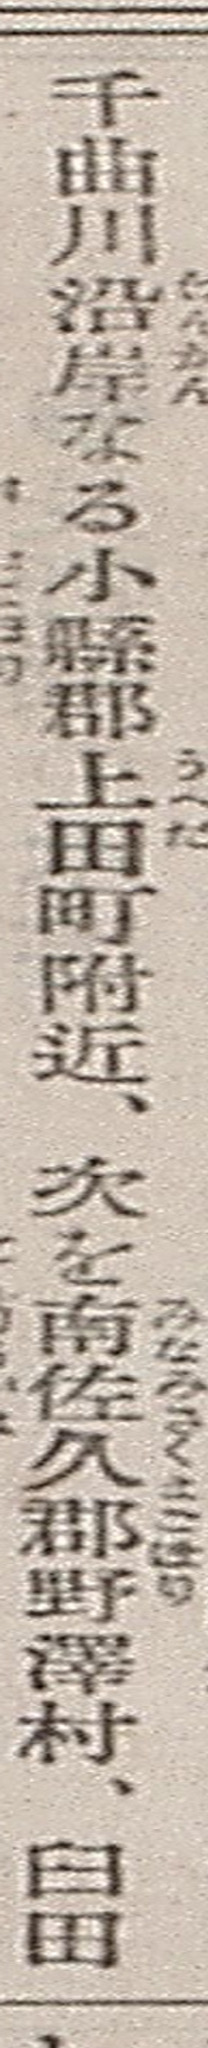千曲川沿岸なる小県郡上田町附近、次を南佐久郡野沢村、臼田
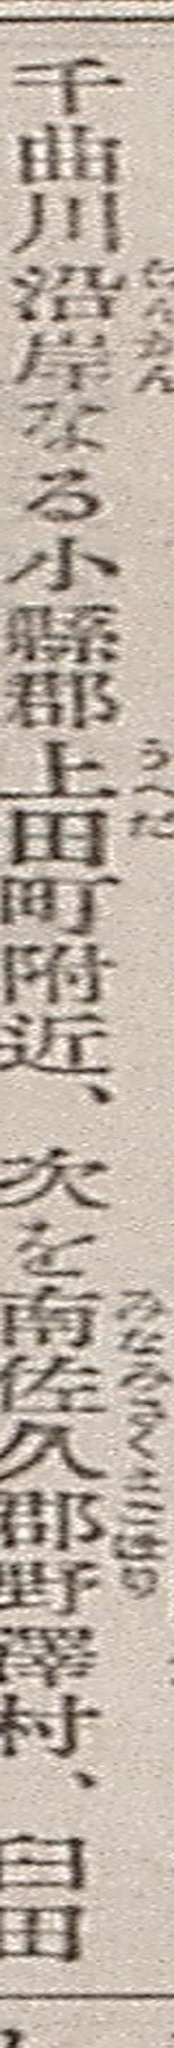千曲川沿岸なる小県郡上田町附近、次を南佐久郡野沢村、臼田
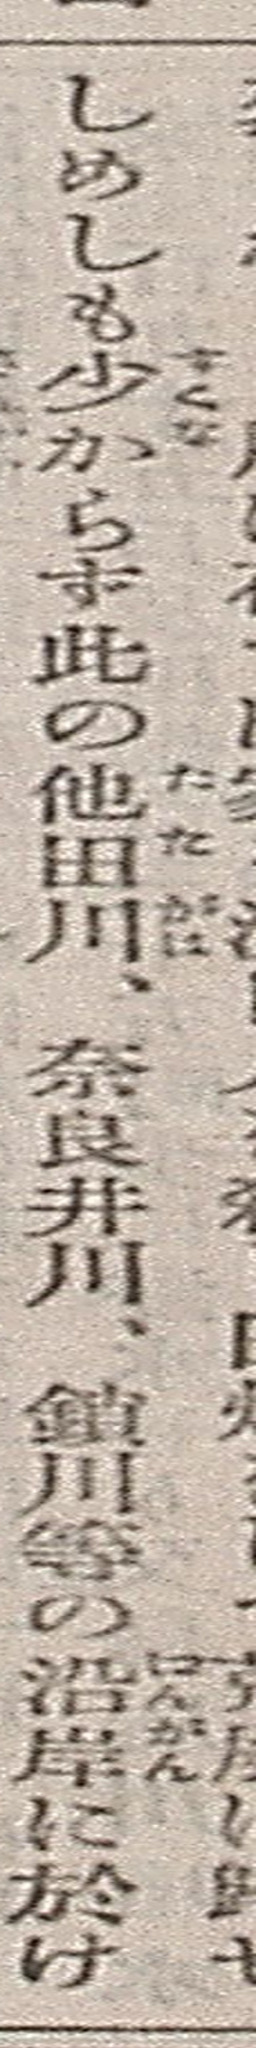しめしも少からず此の他田川、奈良井川、鎖川等の沿岸に於け
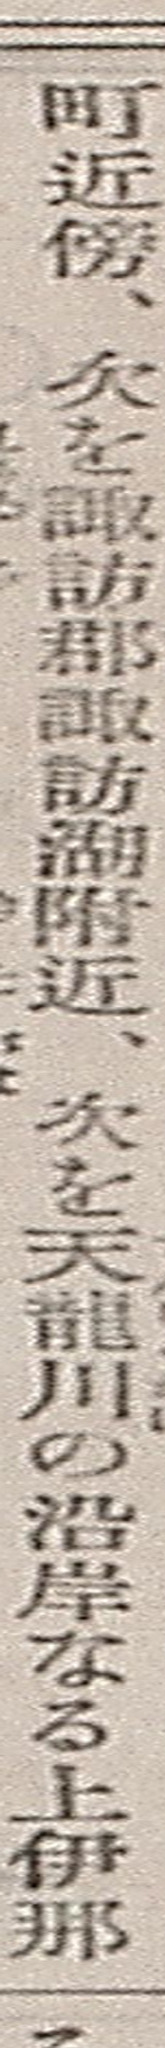町近傍、次を諏訪郡諏訪湖附近、次を天竜川の沿岸なる上伊那
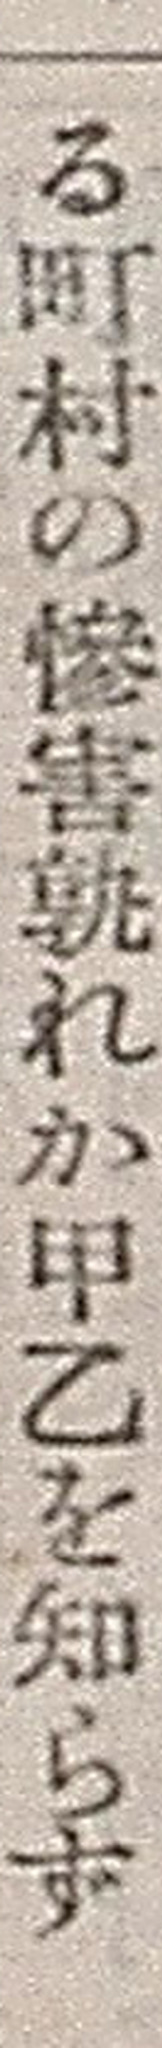る町村の惨害孰れか甲乙を知らず
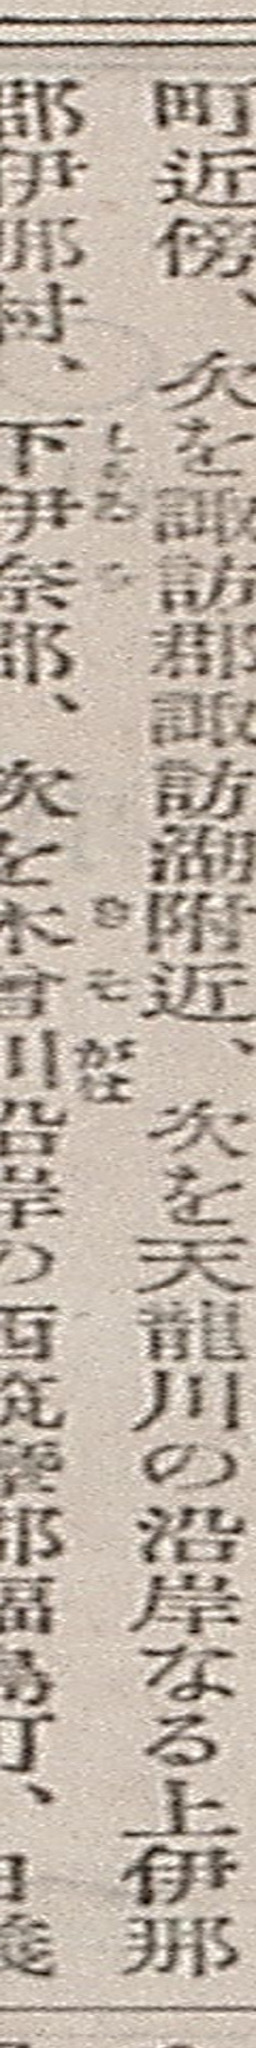郡伊那村、下伊奈郡、次を木曽川沿岸の西筑摩郡福島町、日義
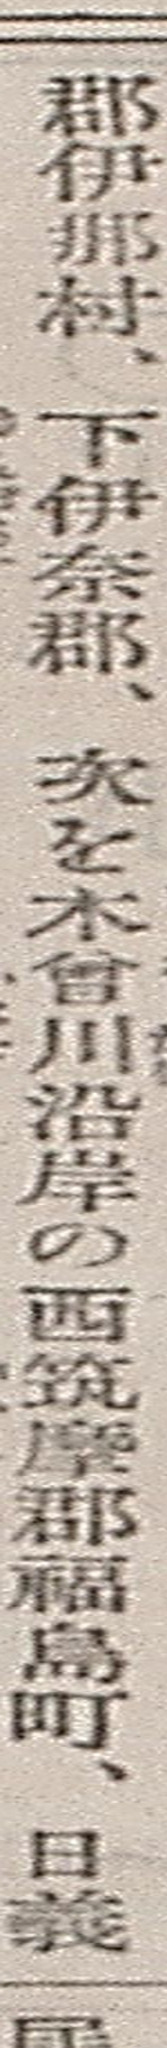郡伊那村、下伊奈郡、次を木曽川沿岸の西筑摩郡福島町、日義
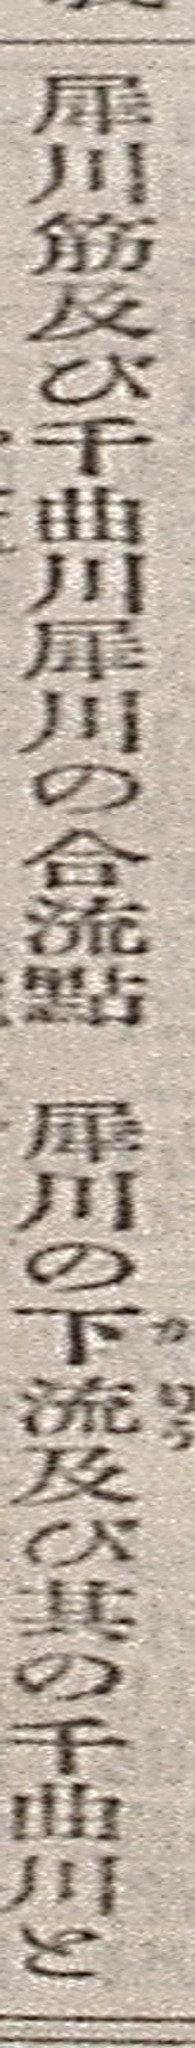犀川筋及び千曲川犀川の合流点犀川の下流及び其の千曲川と
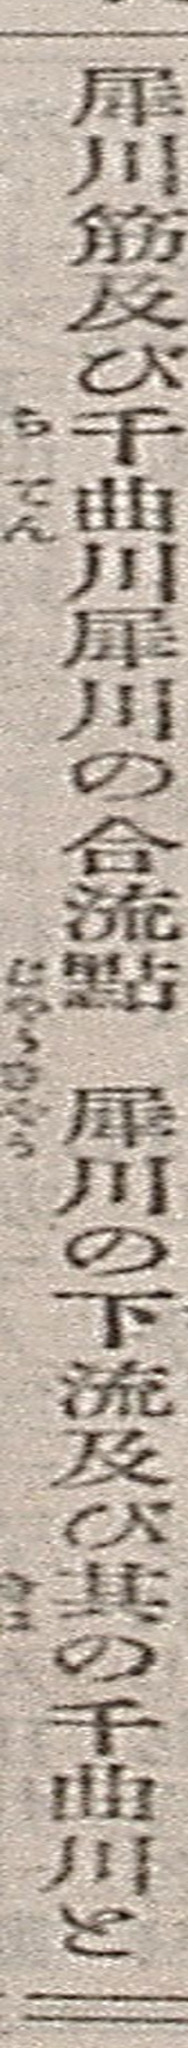犀川筋及び千曲川犀川の合流点犀川の下流及び其の千曲川と
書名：風俗畫報臨時増刊第百二十六號　洪水被害録（中）
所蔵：東京大学地震研究所図書室 Earthquake Research Institute Library, The University of Tokyo, JAPAN
